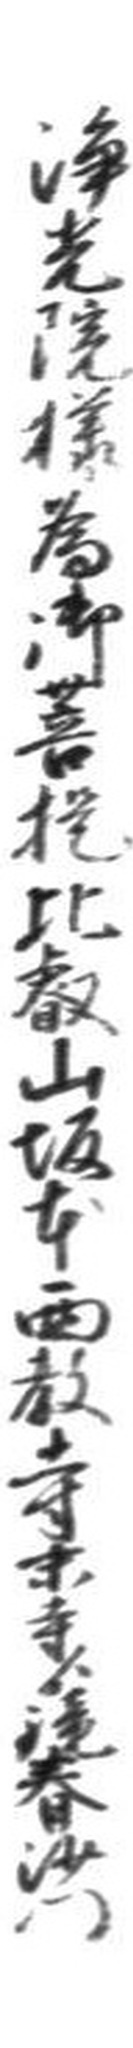浄光院様為御菩提比叡山坂本西教寺末寺ゟ鏡春沙門

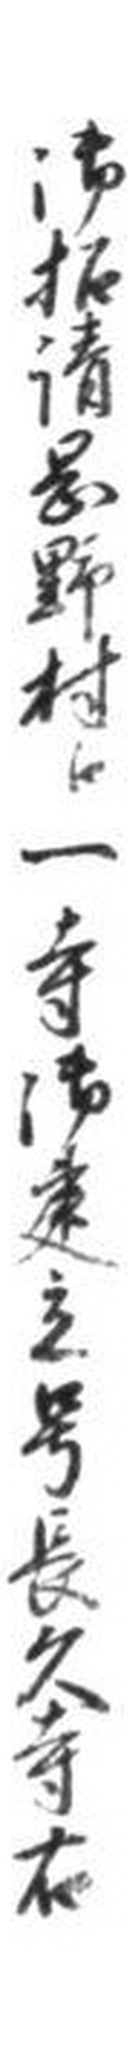御招請岡野村江一寺御建立号長久寺右
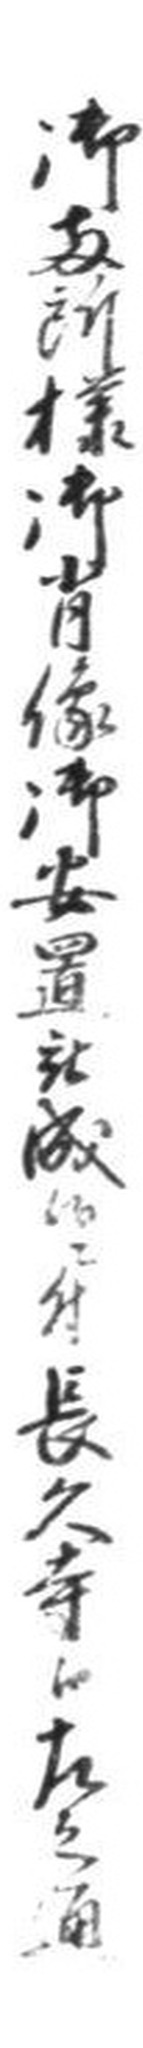御両所様御肖像御安置被成候ニ付長久寺江左之通
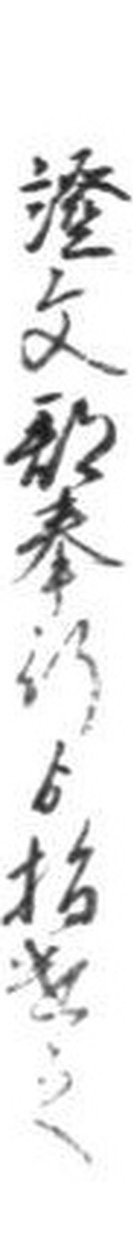証文郡奉行ゟ指遣之
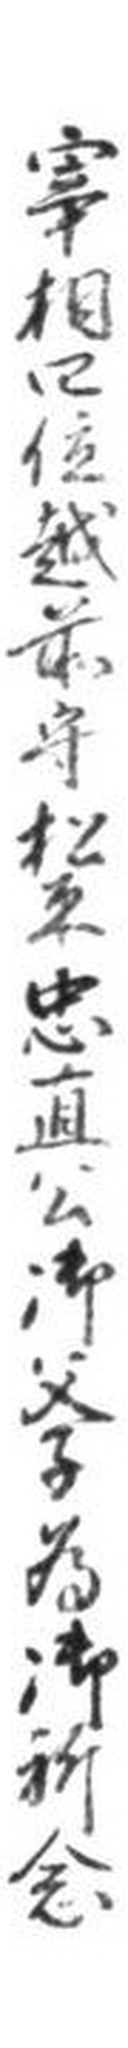宰相四位越前守松平忠直公父子為御祈念
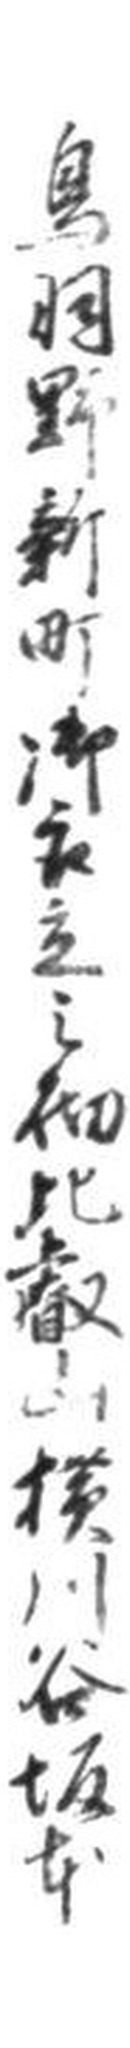鳥羽野新町御取立之砌比叡山横川谷坂本
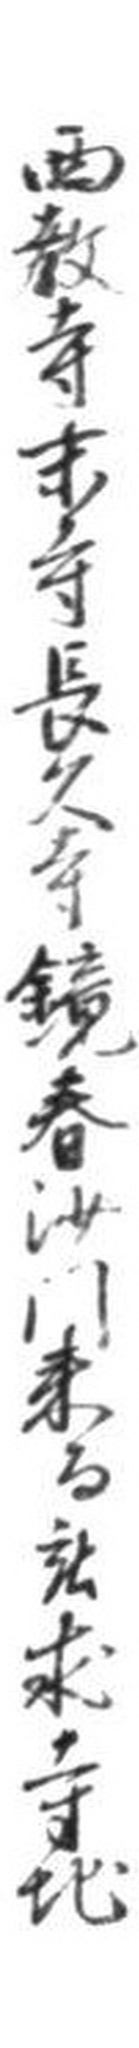西教寺末寺長久寺鏡春沙門来而被求寺地
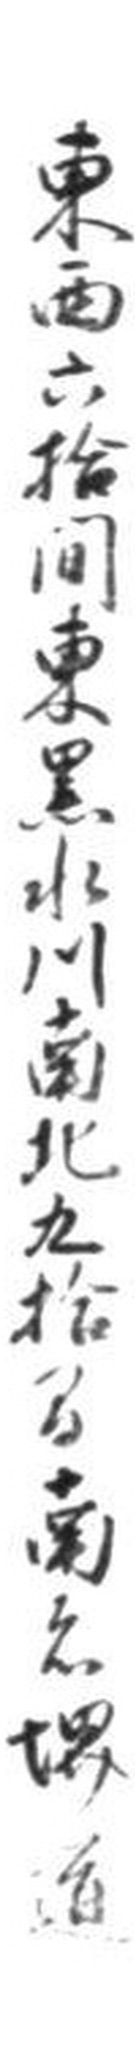東西六拾間東黒水川南北九拾間南者堺道
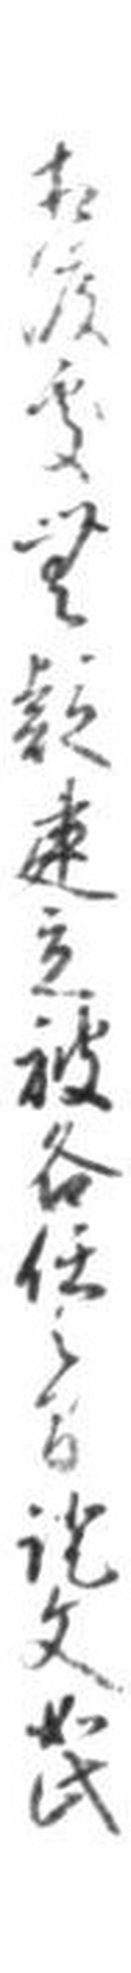相渡所無疑建立被各任之間証文如此
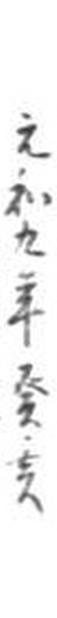元和九年癸亥
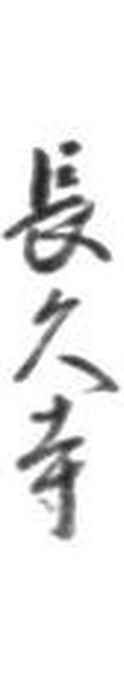長久寺
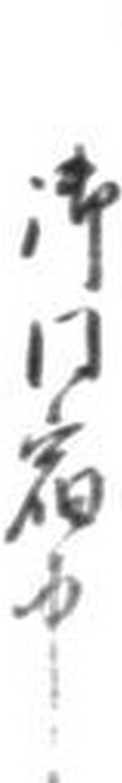御同宿中
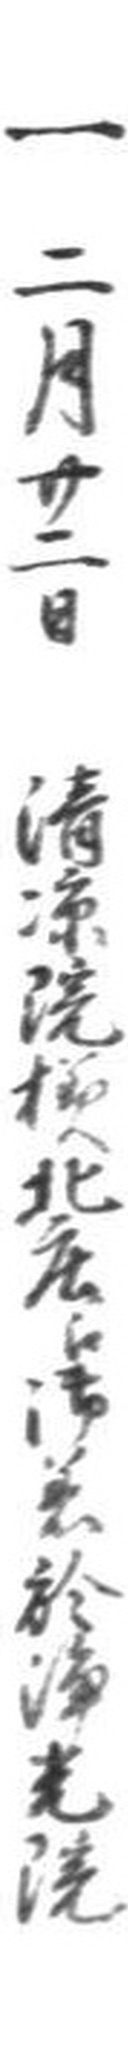一二月廿二日清涼院様北庄江御着於浄光院
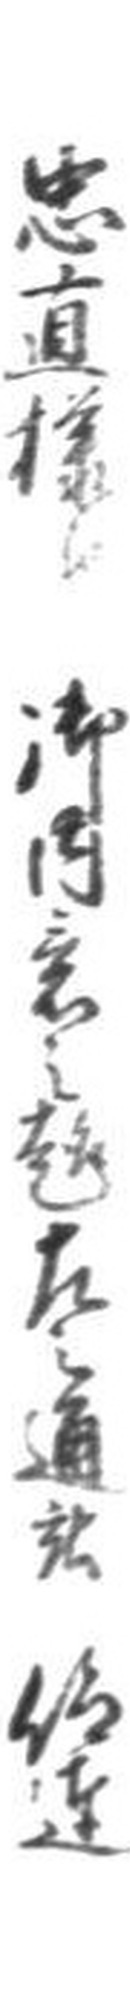忠直様江御内意之趣左之通被仰達

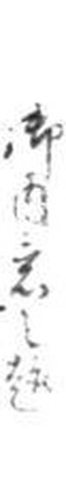御内意之趣
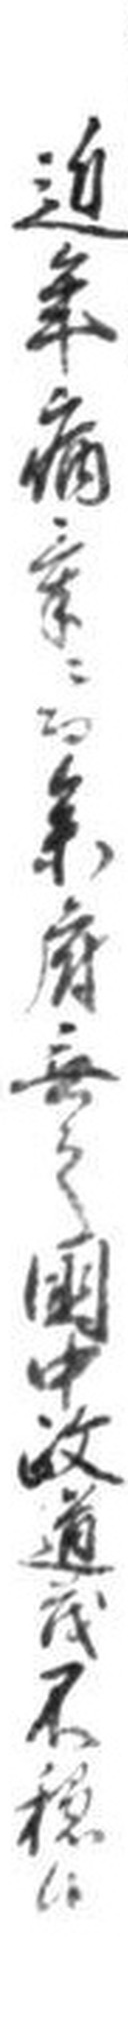近年病気ニ而参府無之国中政道茂不穏候
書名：家譜 二 忠直公 従文禄四年到慶安四年
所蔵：福井県文書館 Fukui Prefectural Archives
